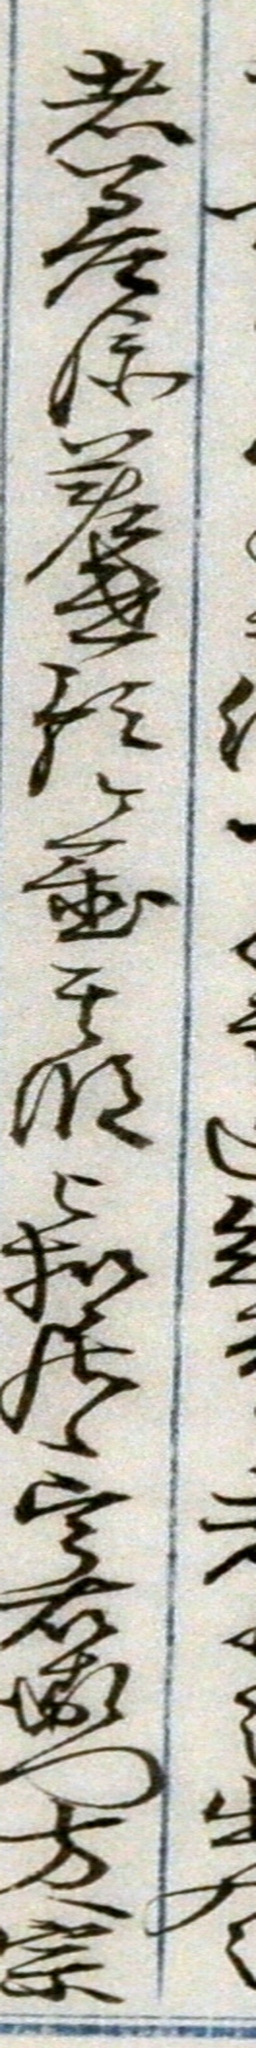者差添差遣預ヶ置其段被扣居候宇右衛門方へ宗
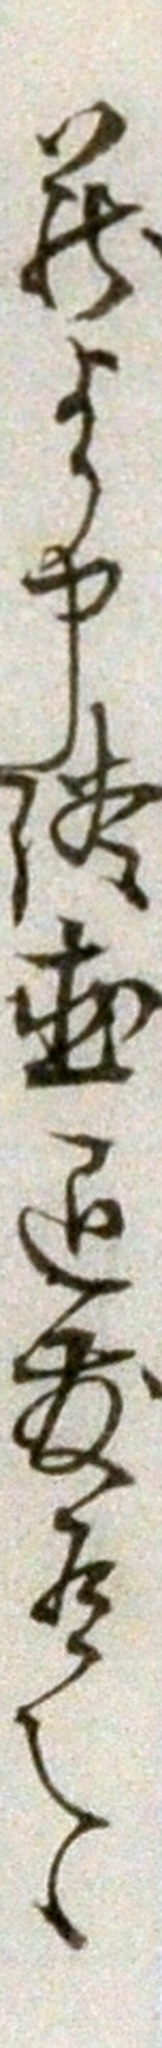蔵より申談直退散有之候
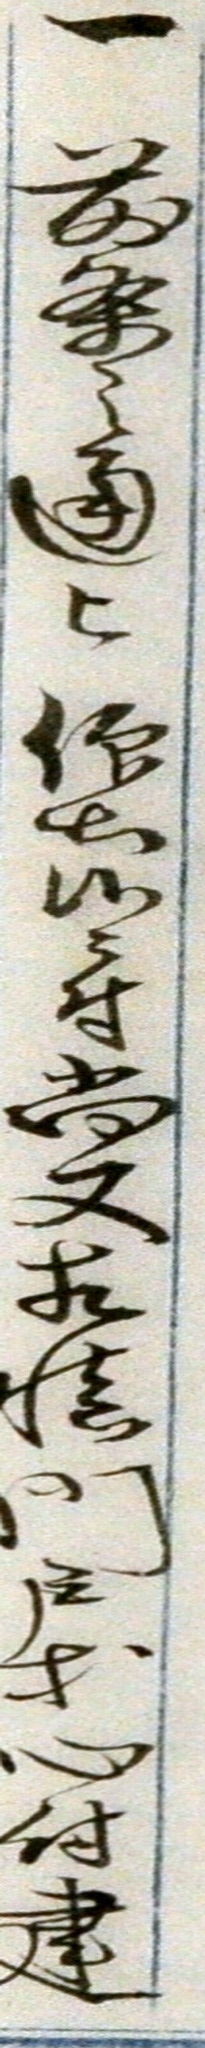一前条之通被仰出候ニ付尚又相慎門戸抔心付建
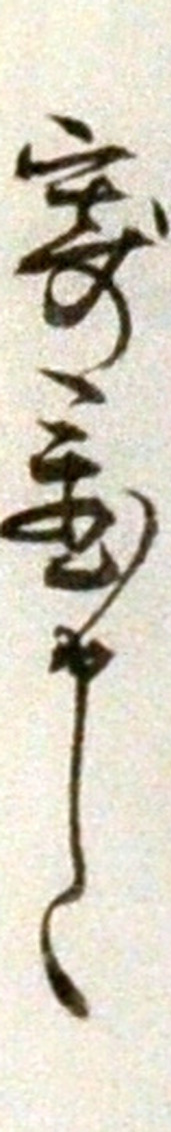寄置申候

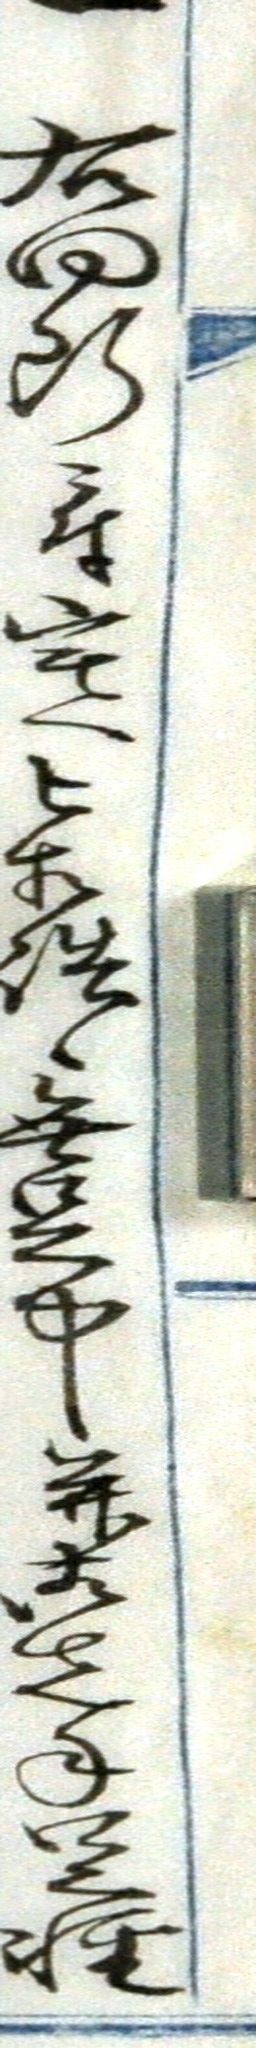一右同断ニ付宅へ被相詰候無足中幷御先手足輕
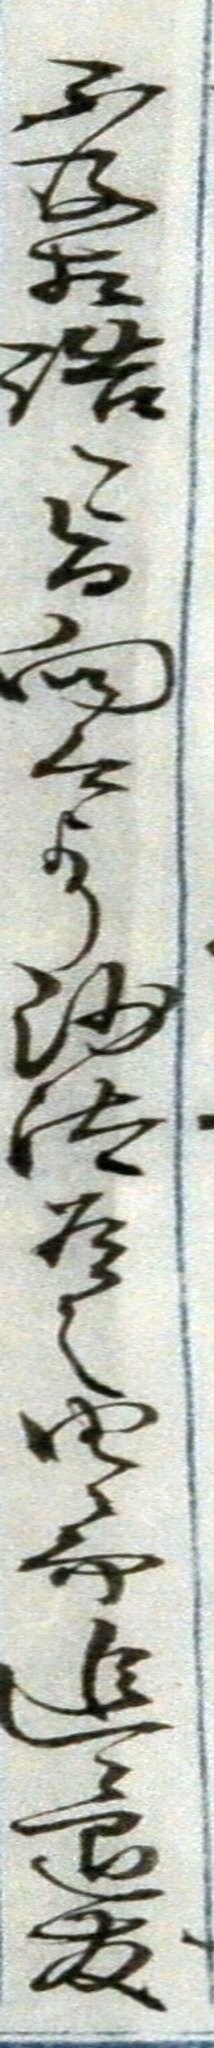不及相詰候旨向々より沙汰有之由ニ而追々退散
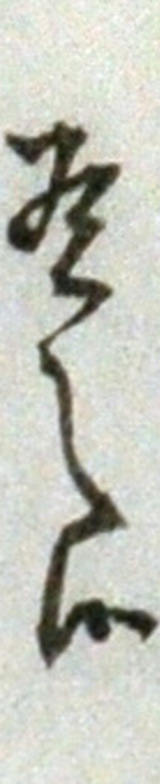有之候
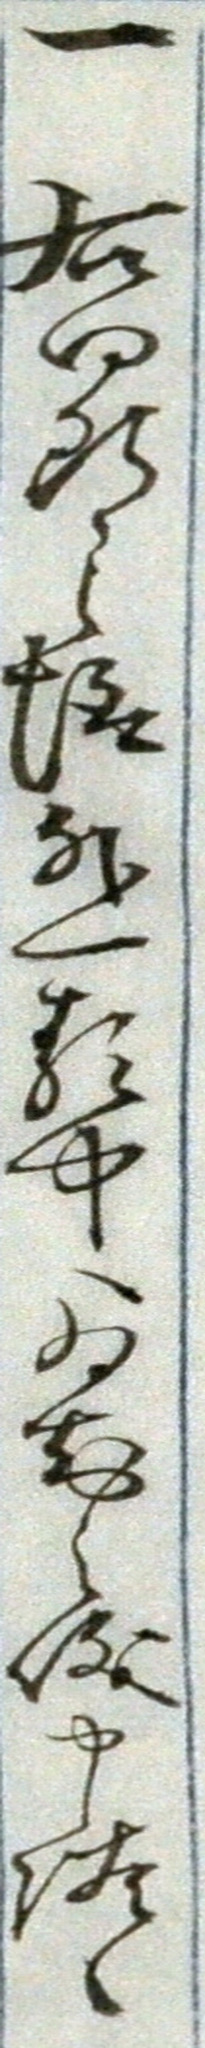一右同断之趣外一類中へ為知之儀申談候
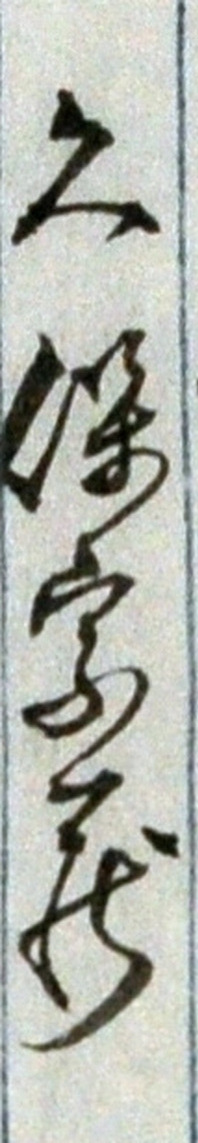久保宗蔵
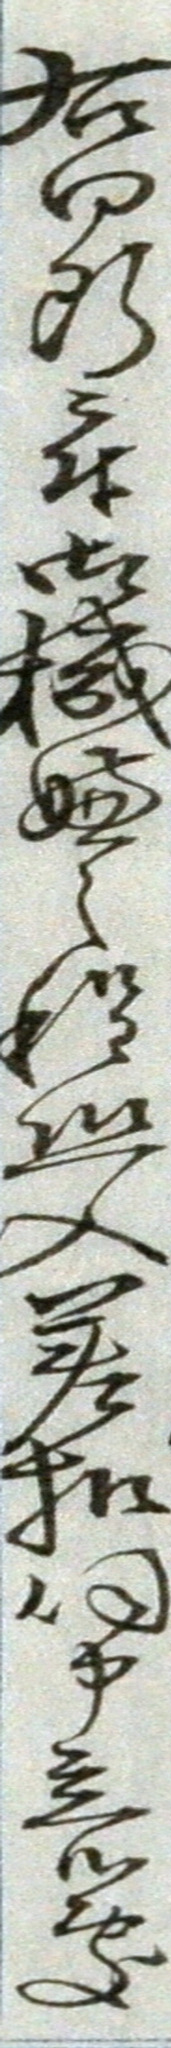右同断ニ付御機嫌之程恐入差扣伺申立候處
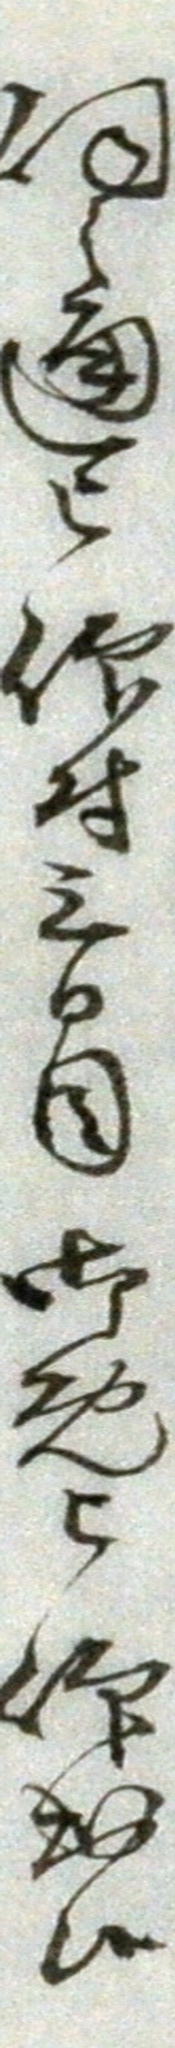伺之通被仰付三日目御免被仰出候
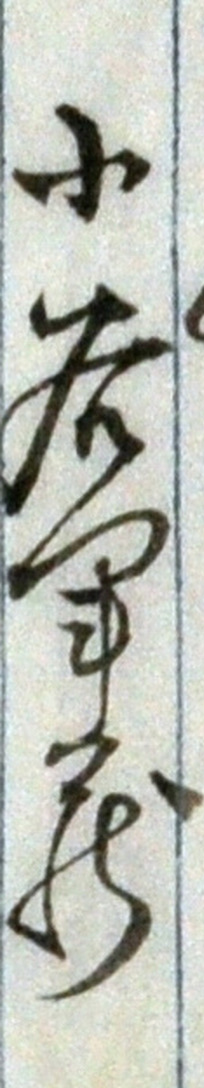小谷軍蔵
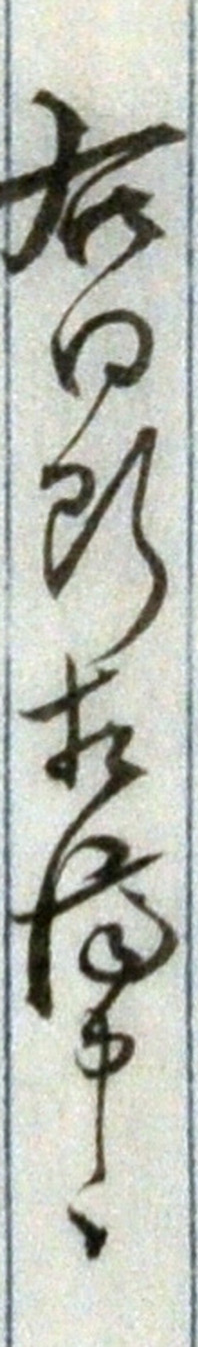右同断相済申候
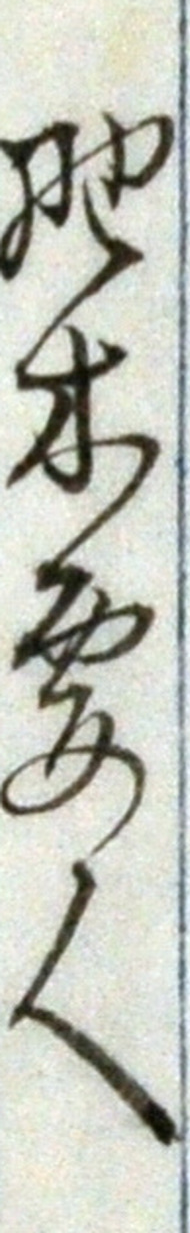野木要人
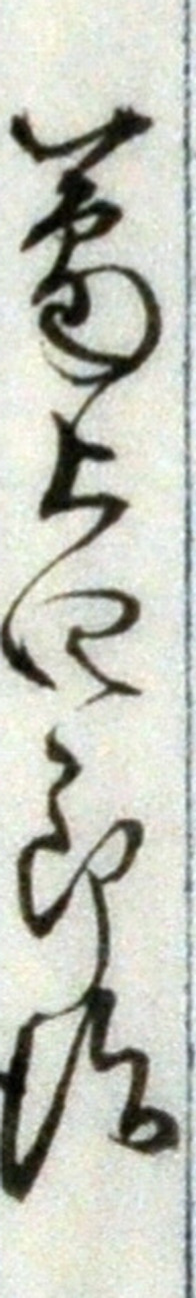葛上四郎治
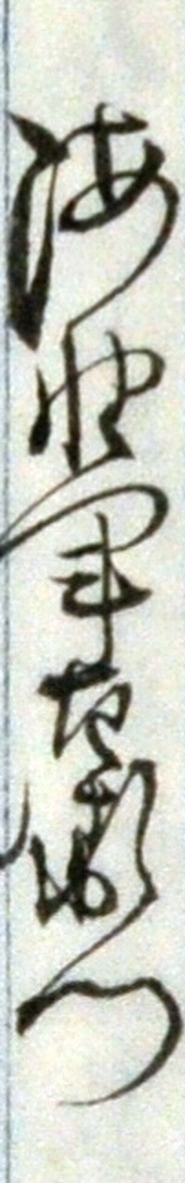海野軍左衛門
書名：川面小藤太子細有之多賀谷唯右衛門ヲ打果候一件
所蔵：伊那市立高遠町図書館・合同会社AMANE
